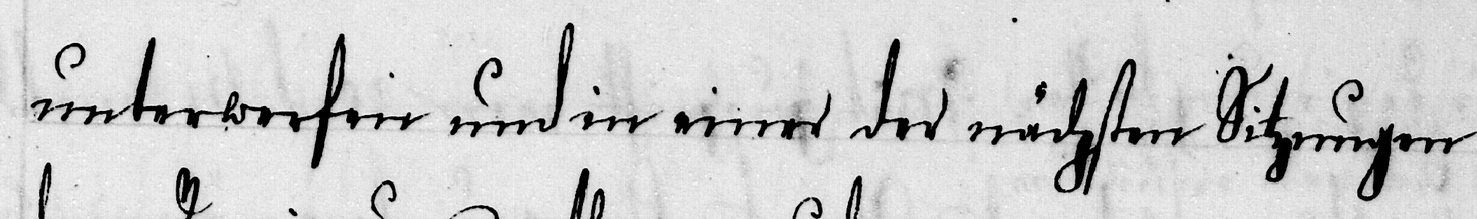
unterwerfen und in einer der nächsten Sitzungen
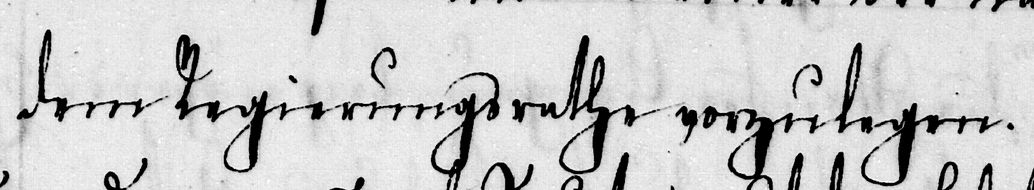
dem Regierungsrathe vorzulegen.
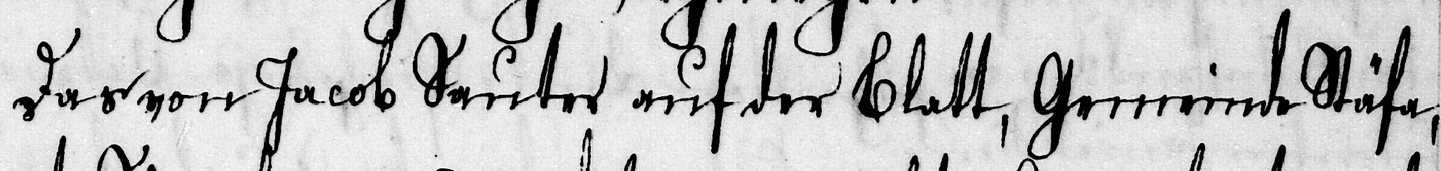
Das von Jacob Sauter auf der Blatt, Gemeinde Stäfa,
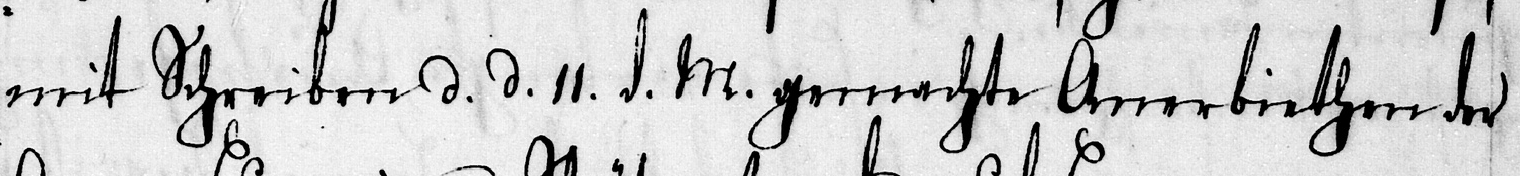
mit Schreiben d. d. 11. d. M. gemachte Anerbiethen der
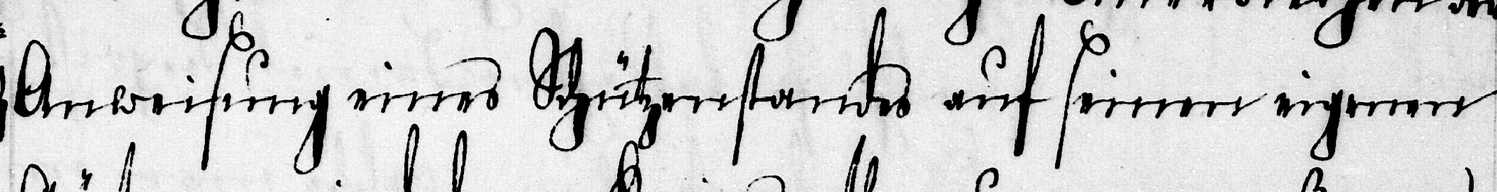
Anweisung eines Schützenstandes auf seinen eigenen
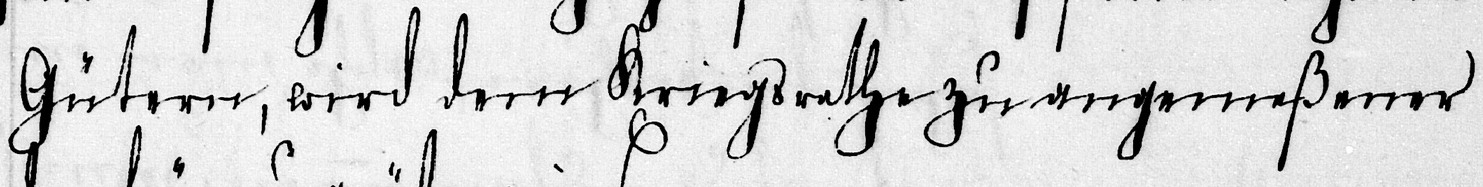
Gütern, wird dem Kriegsrathe zu angemeßener
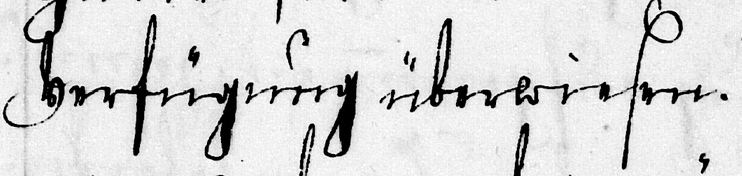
Verfügung überwiesen.
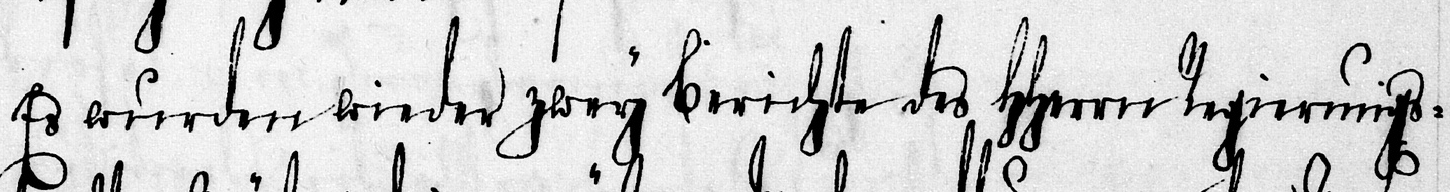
Es wurden wieder zwey Berichte des Herrn Regierungs¬
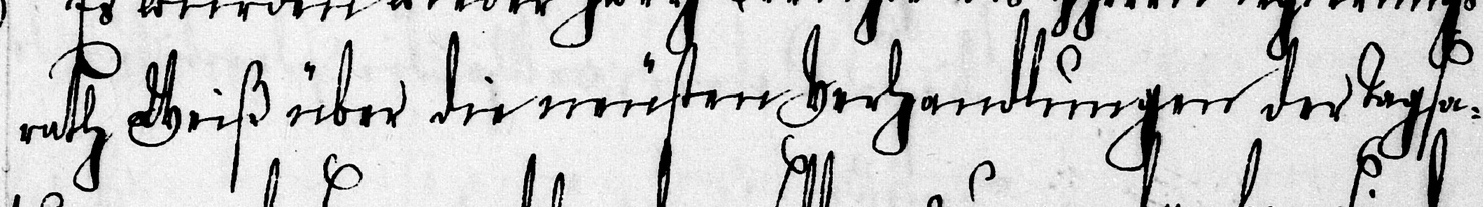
rath Weiß über die neusten Verhandlungen der Tagsa¬
